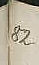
82.
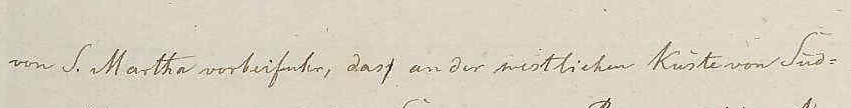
von S. Martha vorbeifuhr, dass an der westlichen Küste von Süd-
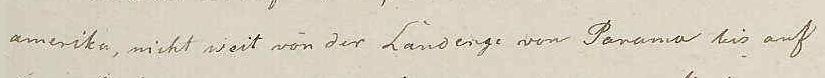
amerika, nicht weit von der Landenge von Panama bis auf
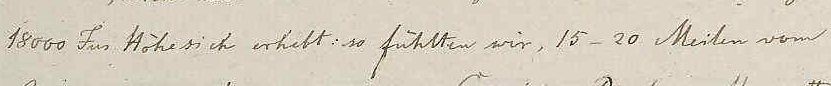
18000 Fus Höhe sich erhebt: so fühlten wir, 15–20 Meilen vom
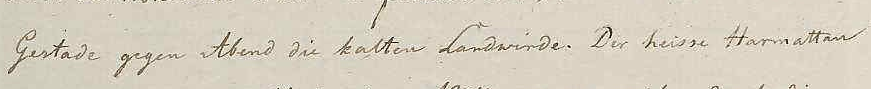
Gestade gegen Abend die kalten Landwinde. Der heisse Harmattan
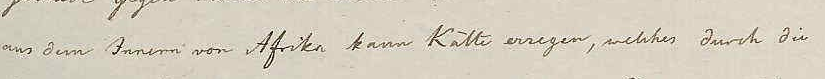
aus dem Innern von Afrika kann Kälte erregen, welches durch die
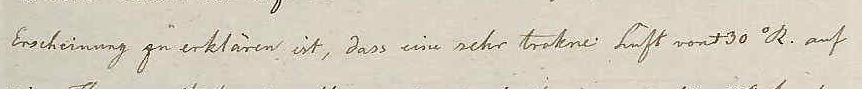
Erscheinung zu erklären ist, dass eine sehr trokne Luft von +30° R. auf
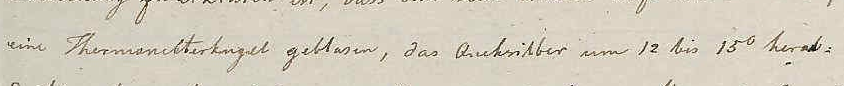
eine Thermometerkugel geblasen, das Queksilber um 12 bis 15° herab-
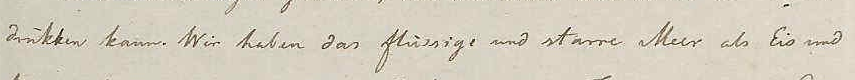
drükken kann. Wir haben das flüssige und starre Meer als Eis und
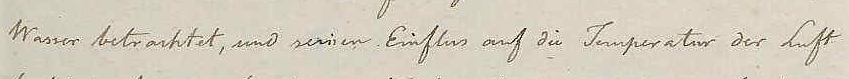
Wasser betrachtet, und seinen Einflus auf die Temperatur der Luft
